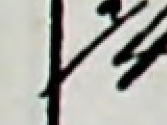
74
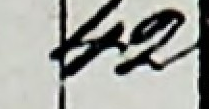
42
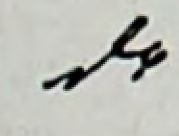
do
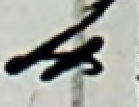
4
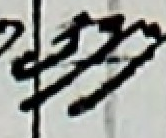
577
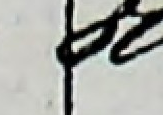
80
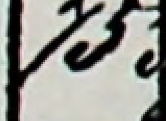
75
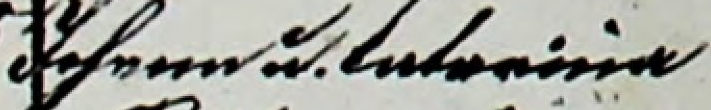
Johann u. Catarina
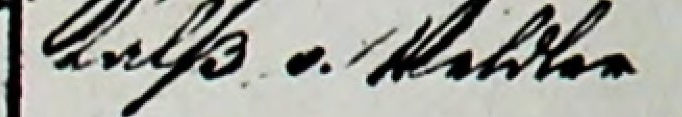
Kalß v. Weldter
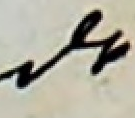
do
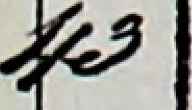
43
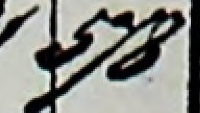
578
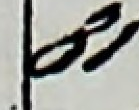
81
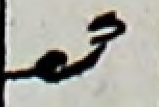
3
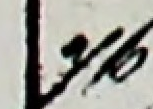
76
